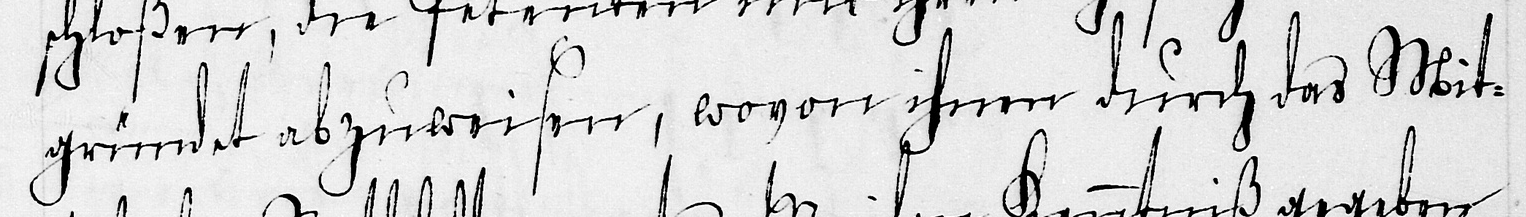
gründet abzuweisen, wovon ihnen durch das Mit¬
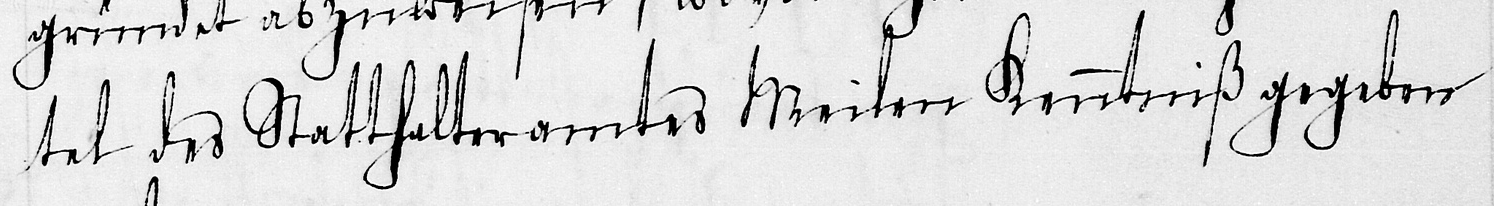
tel des Statthalteramtes Meilen Kenntniß gegeben
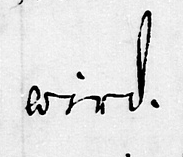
wird.
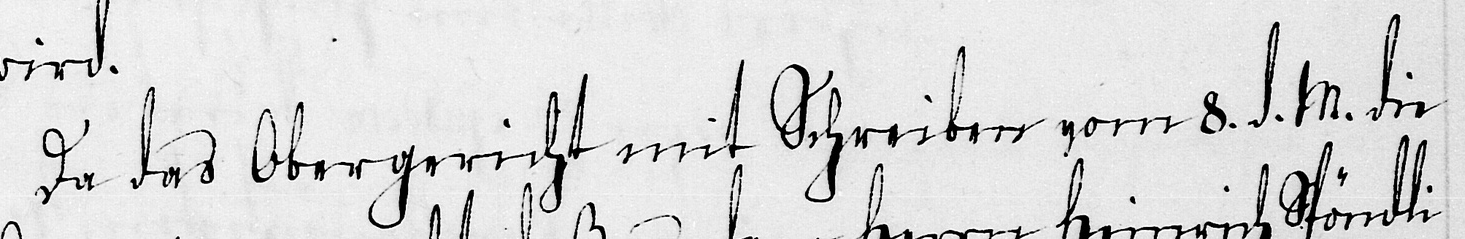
Da das Obergericht mit Schreiben vom 8. d. M. die
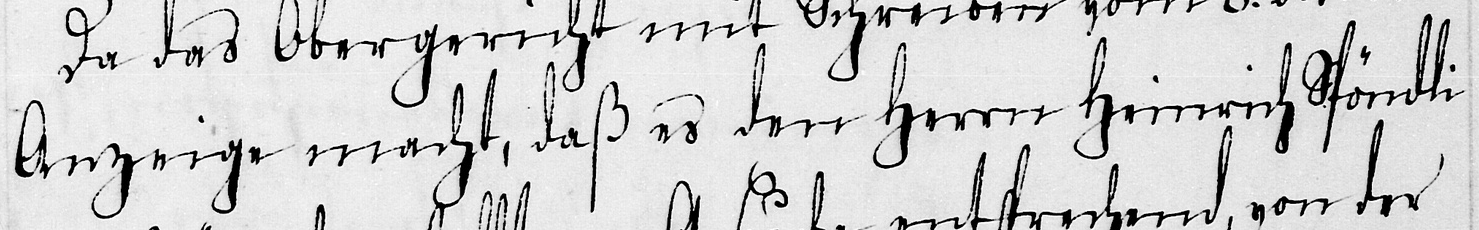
Anzeige macht, daß es den Herrn Heinrich Spöndli
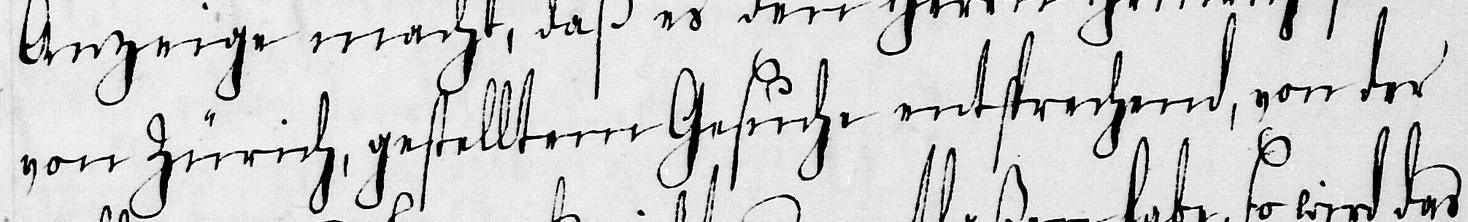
von Zürich, gestelltem Gesuche entsprechend, von der
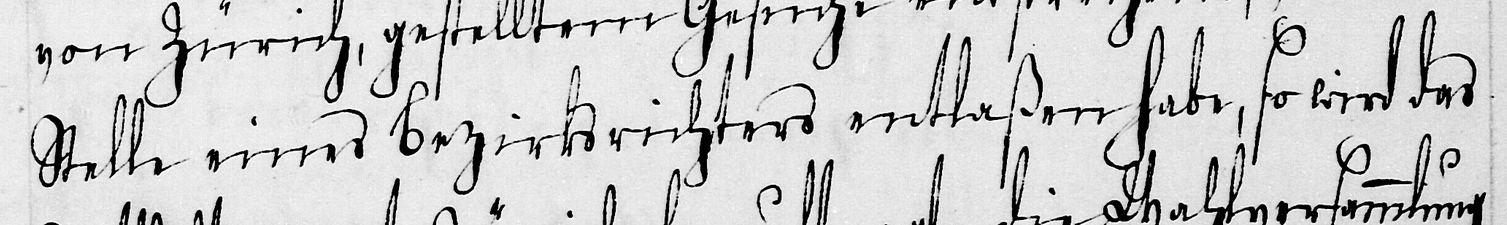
Stelle eines Bezirksrichters entlaßen habe, so wird das
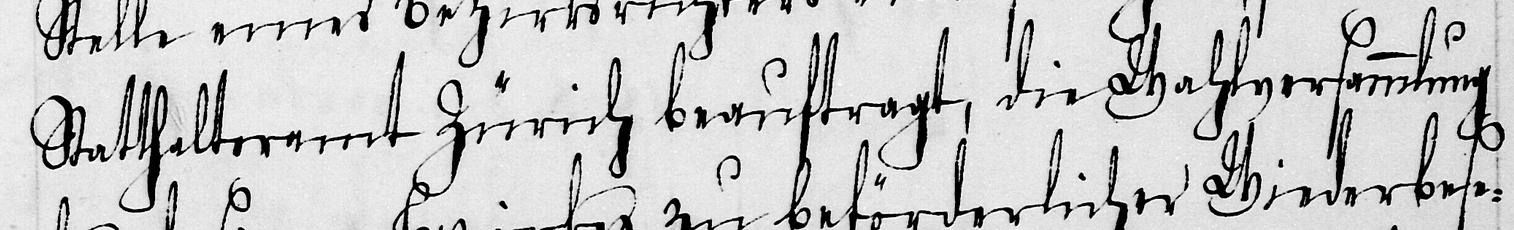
Statthalteramt Zürich beauftragt, die Wahlversammlung
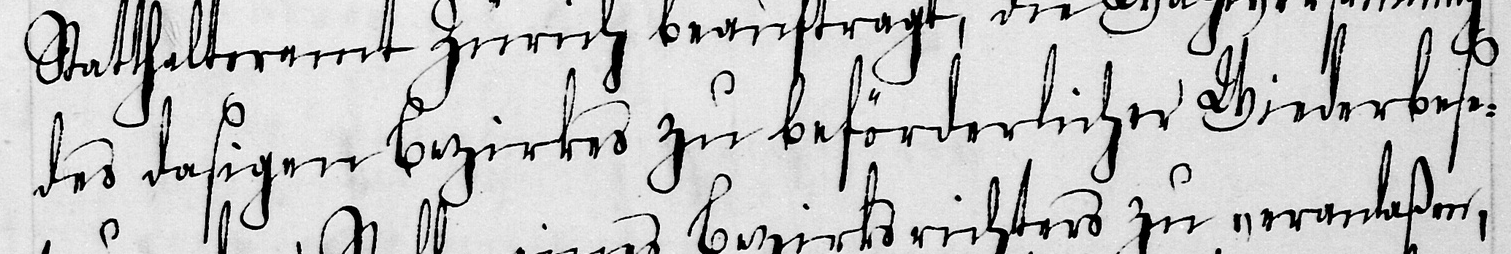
des dasigen Bezirkes zu beförderlicher Wiederbese¬
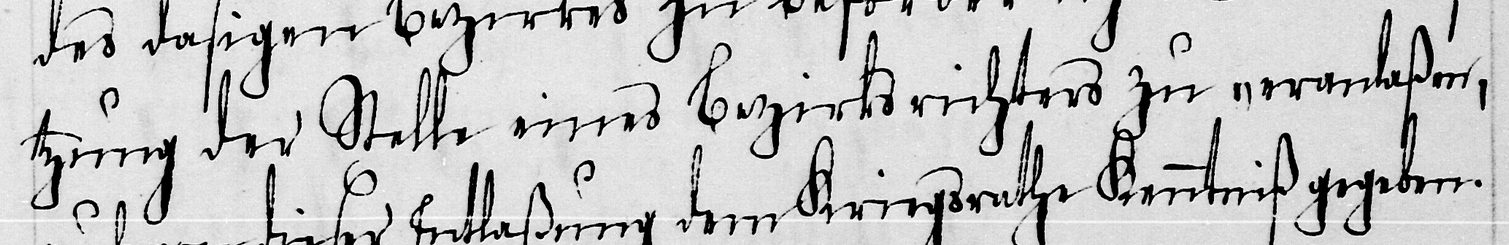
tzung der Stelle eines Bezirksrichters zu veranlaßen,
